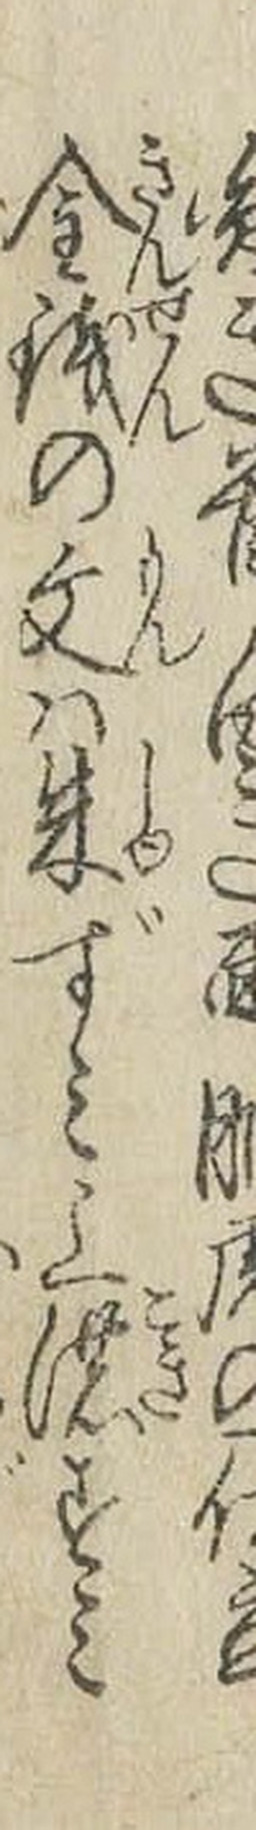に金銭の文は朱ずみ上濃すみ
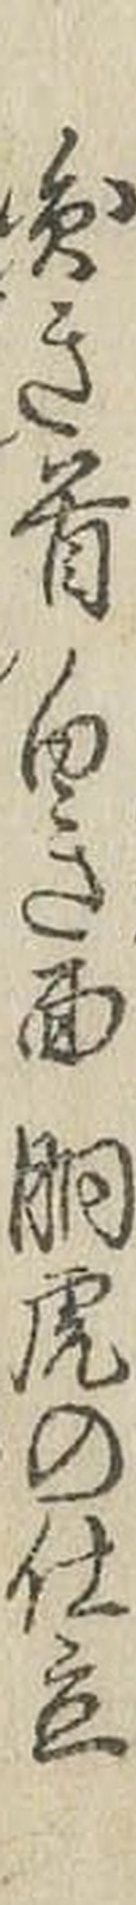円き首白き面胴虎の仕立
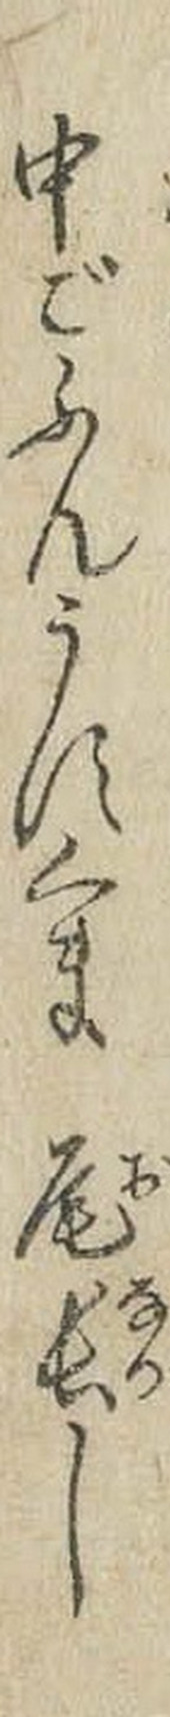中ごふんうすくま尾長し

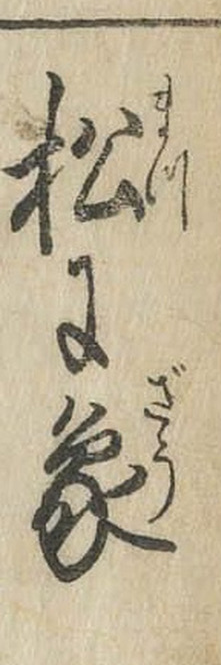松に象
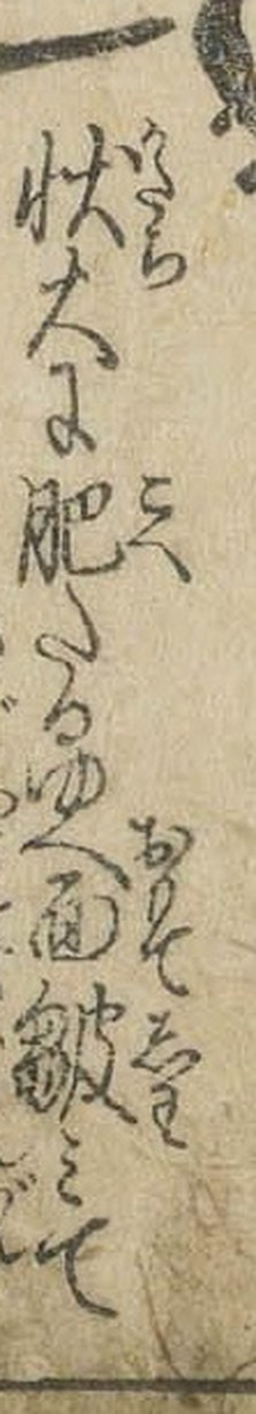状大に肥たるゆへ面皺みて
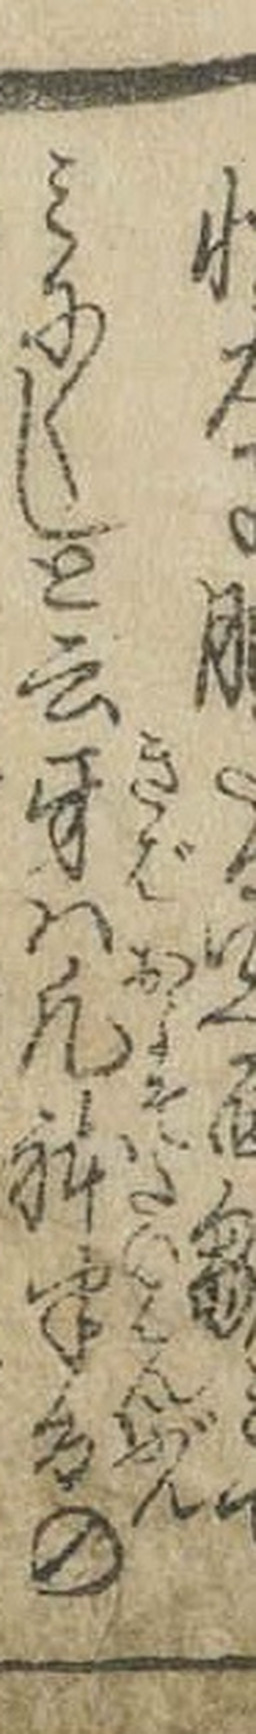みにくしと云牙は凡体半分の
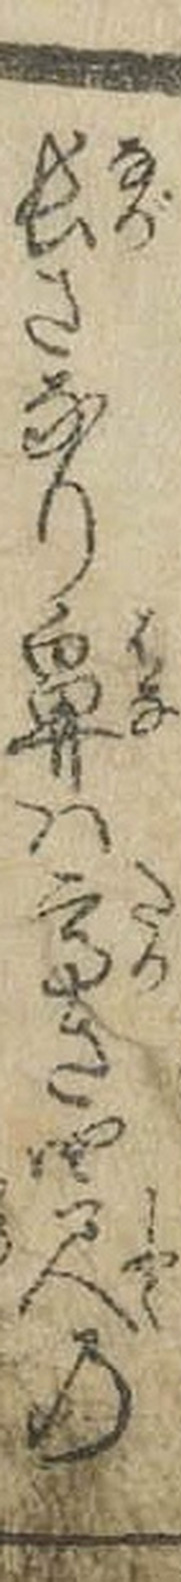長さなり鼻は高さ四尺の
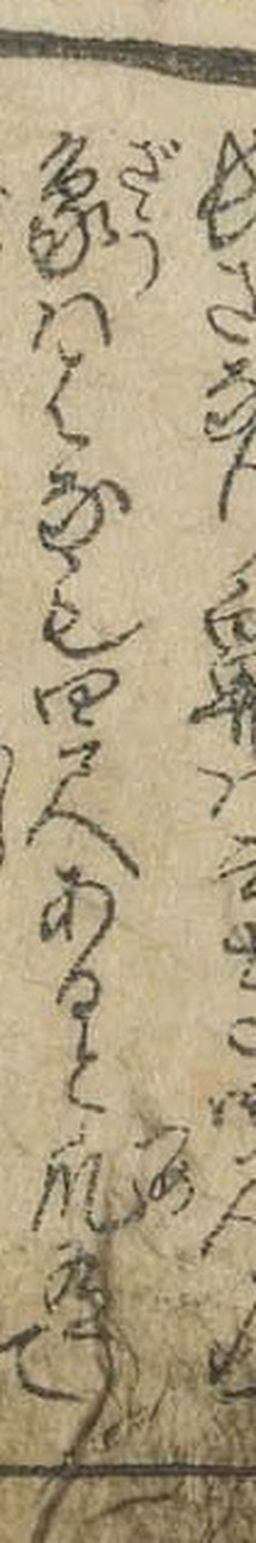象ははなも四尺あると爪有て
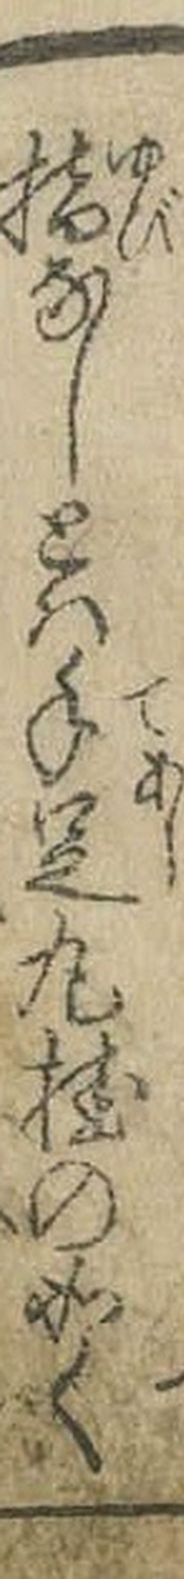指なしとは手足丸柱の如く
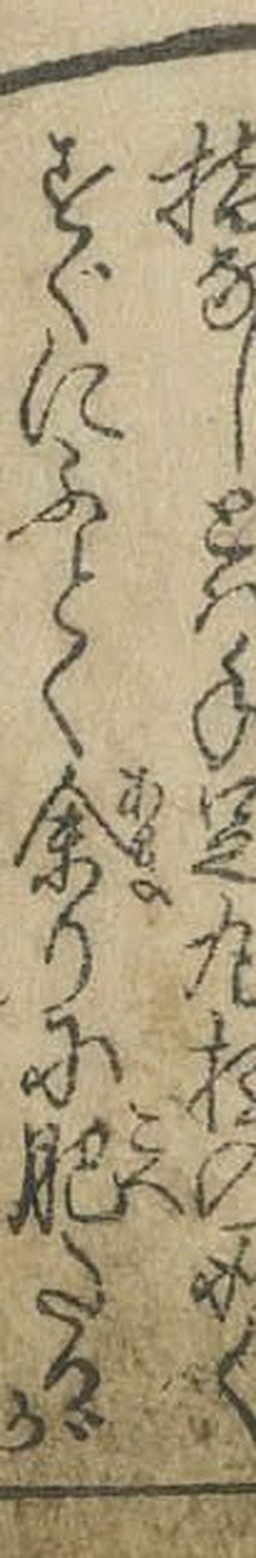すぐにふとく余りに肥たるが

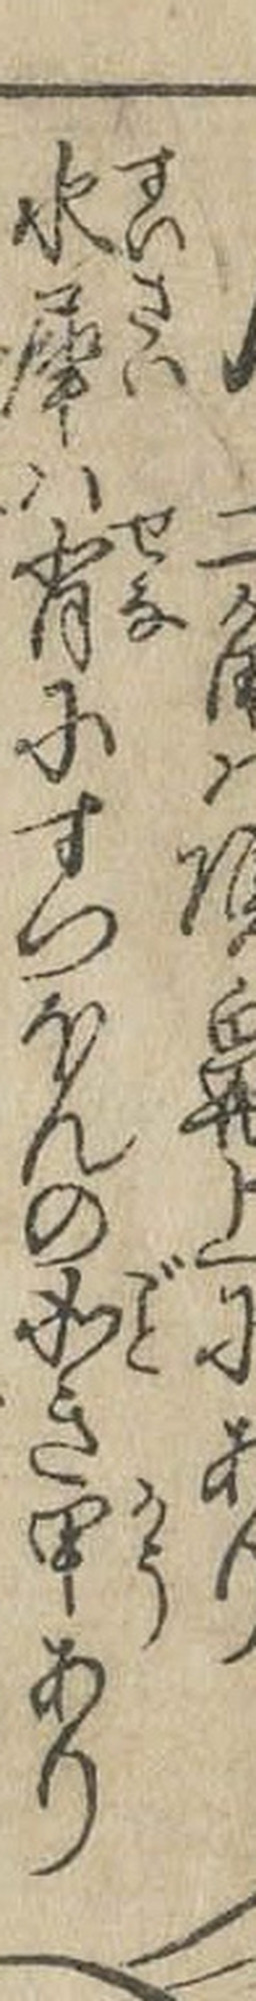水犀は背にすつほんの如き甲あり
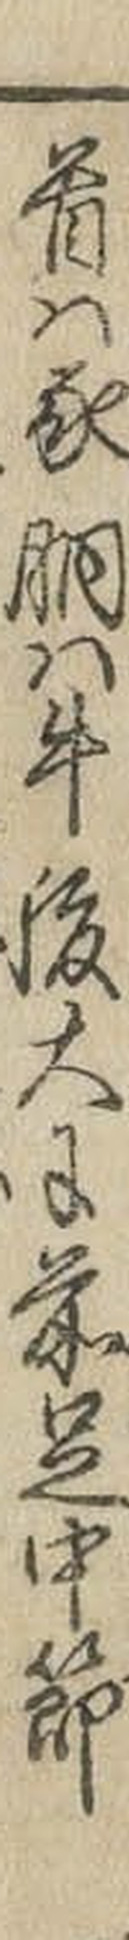首は豕胴は牛腹大に前足中節
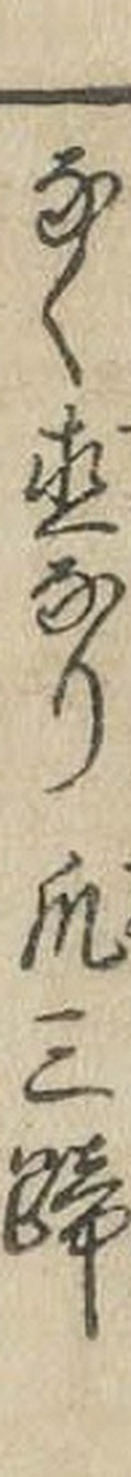なく直なり爪三蹄
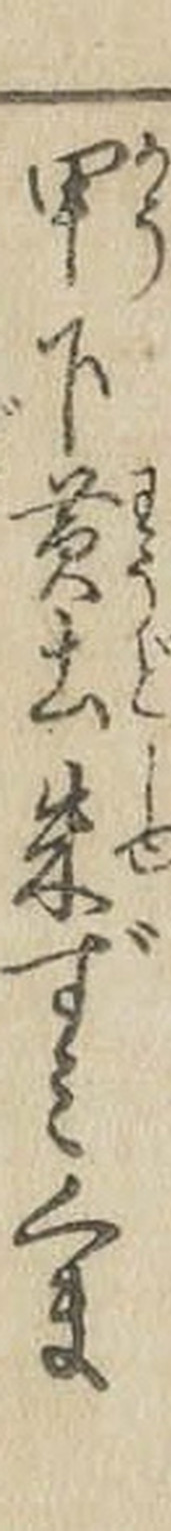甲下黄土朱ずみくま
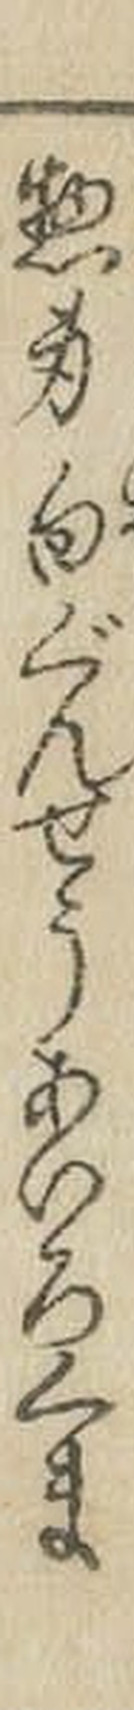総身白ぐんせうあいろくま
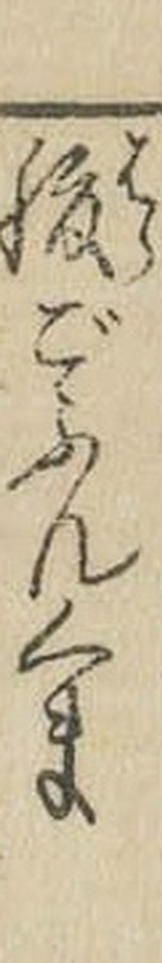腹ごふんくま
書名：絵本写宝袋 9巻 9之巻上
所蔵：東京学芸大学教育コンテンツアーカイブ
